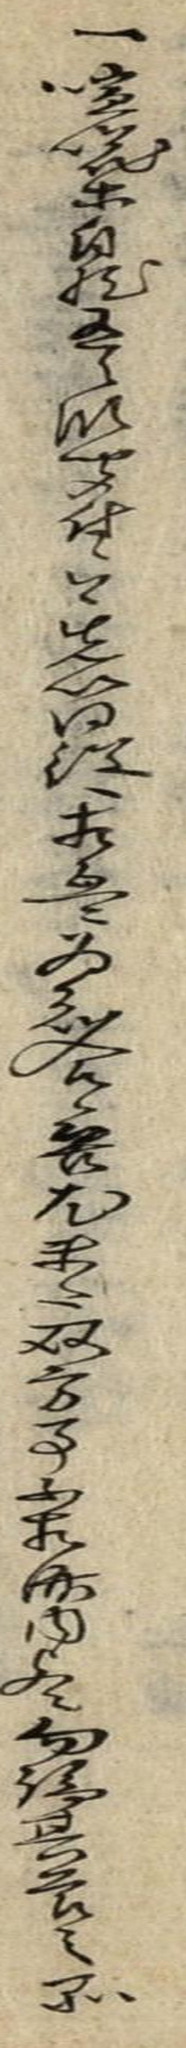一喧嘩等自然有之段聞付候はゝ先以同役へ相互に為知合候筈尤未た双方事不相済内歟勿論其節之品
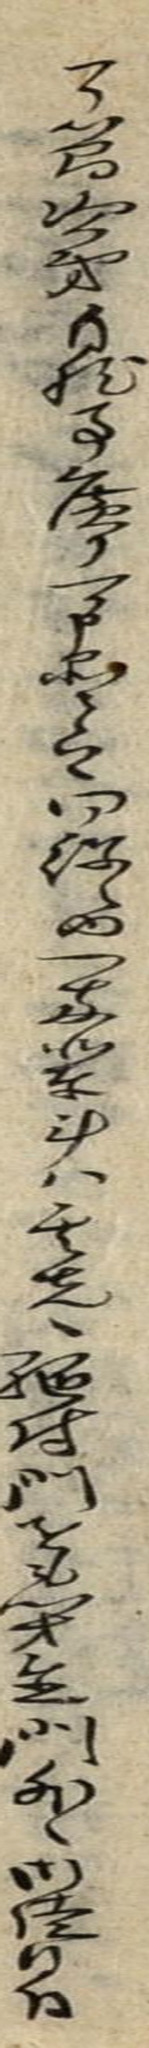了簡次第自然事広り可申品に候はゝ同役之内一両輩斗は其先へ駆付門をも閉置門外へ御徒目付
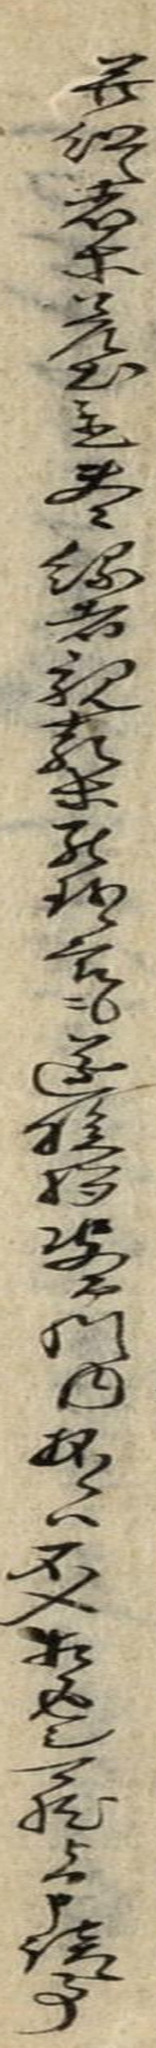并組之者等差出置夫々縁者親類等罷越候節も遂挨拶決て門内抔へは不入相返シ可然旨申談候事
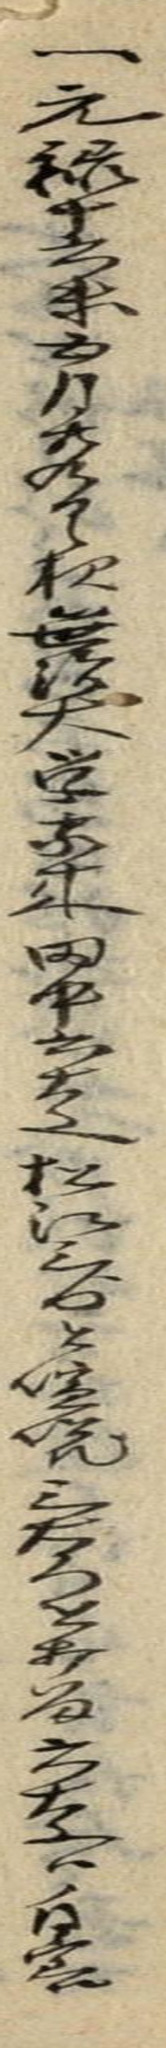一元禄十六未五月廿九日之夜笹沼大学家来田中六大夫松江三右衛門と喧嘩三右衛門を打留六大夫は自害
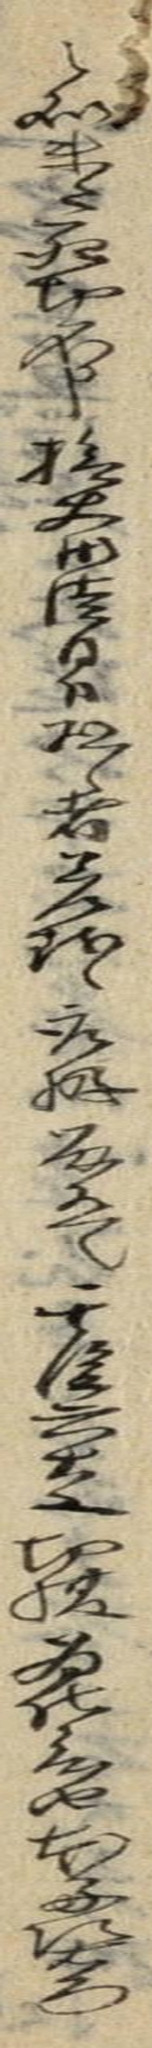之処未た死切不申検使御徒目付組之者差越候取扱留有之其後六大夫切腹為仕度由本多次右衛門
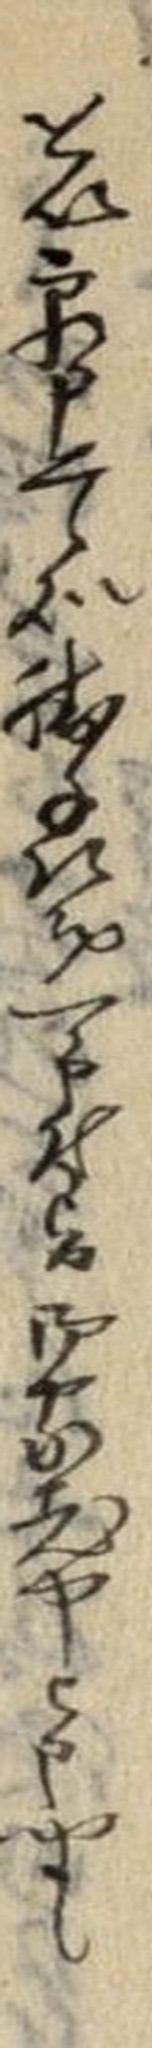を以願申上候処勝手次第可申付旨御家老中被申聞候
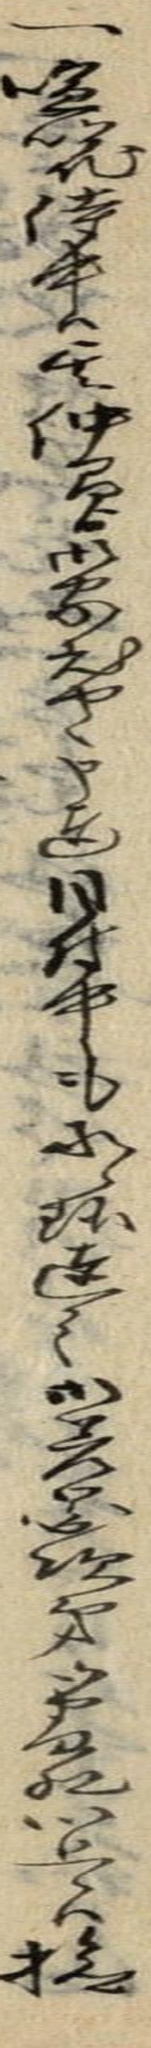一喧嘩侍中は其仲間ゟ御家老中へ申達目付中へも承候趣達之御差図次第御番組以上へは検
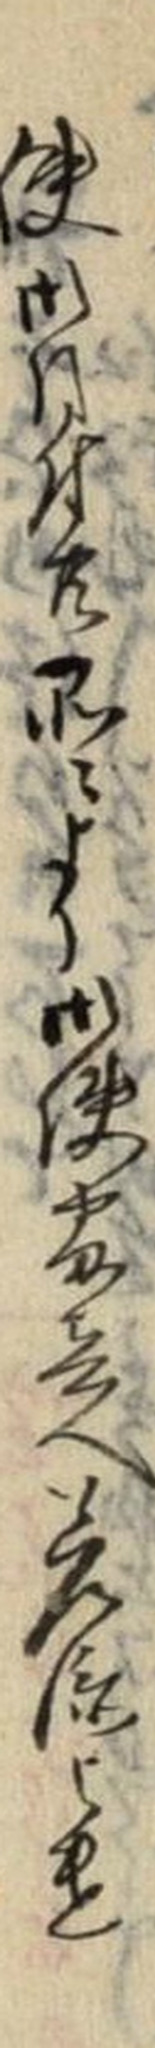使御目付共品により御使番壱人差添被遣
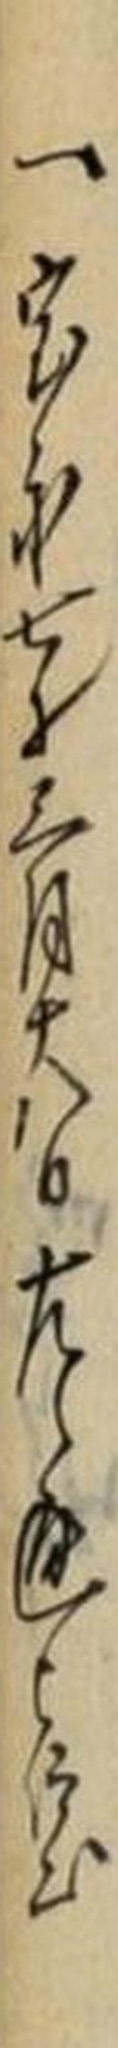一宝永七刁三月十八日左之通被仰出
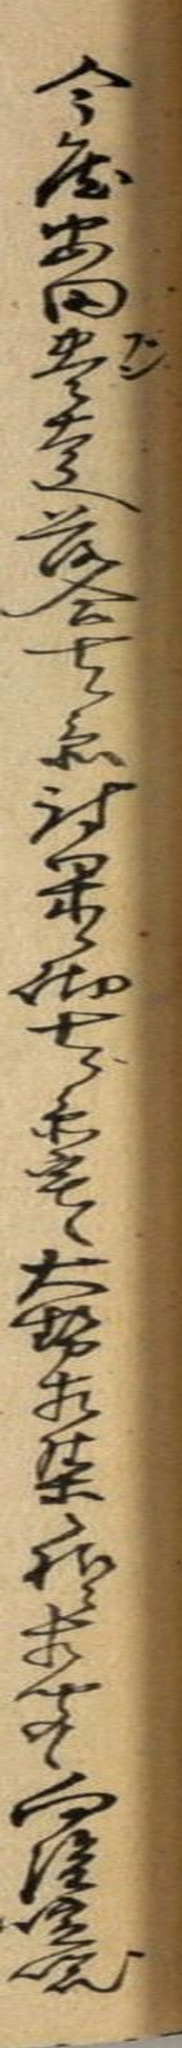今度安田豊大夫落合七郎兵衛討果候砌七郎兵衛宅へ大勢相集候様に相聞候向後喧嘩
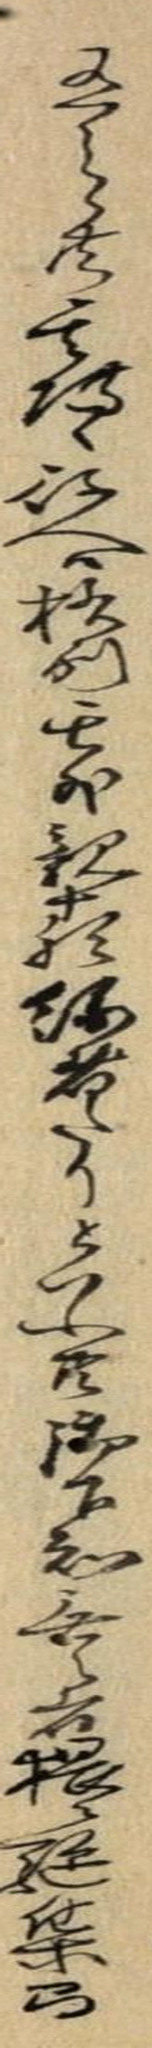有之候共其場へ役人は格別其外親類縁者たりといふ共御下知無之者猥に駆集間
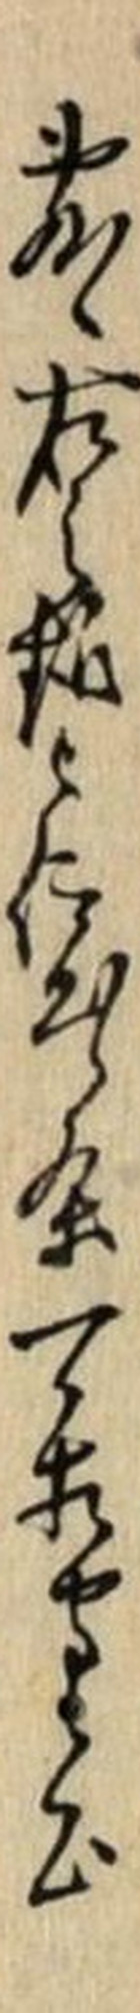敷候右之趣被仰出候条可相守候以上
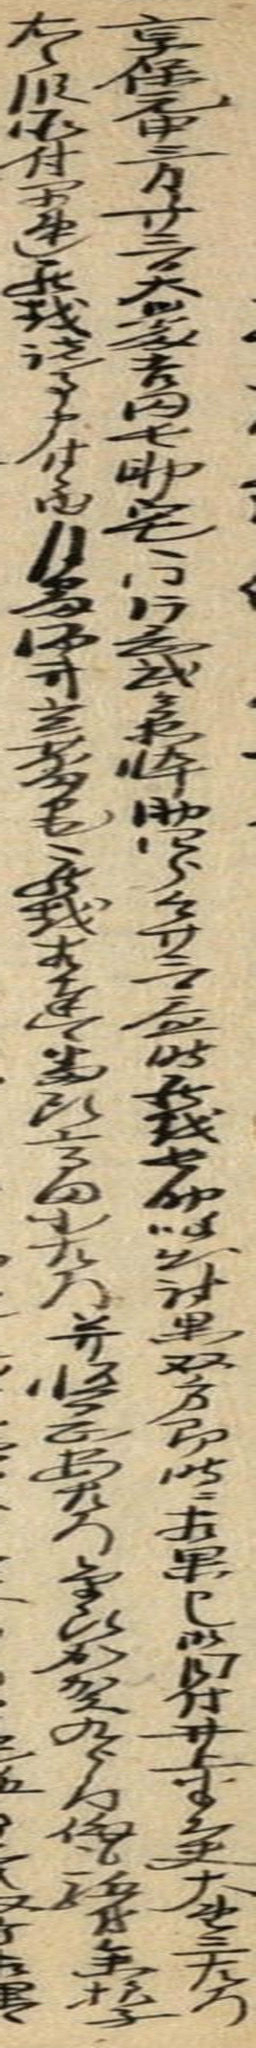右之段承付早速罷越諸事申付候由月番酒井玄蕃宅へ罷越相達候番頭高田小左衛門并恒岡安左衛門筆頭加賀九郎右衛門儀も駆付参様子
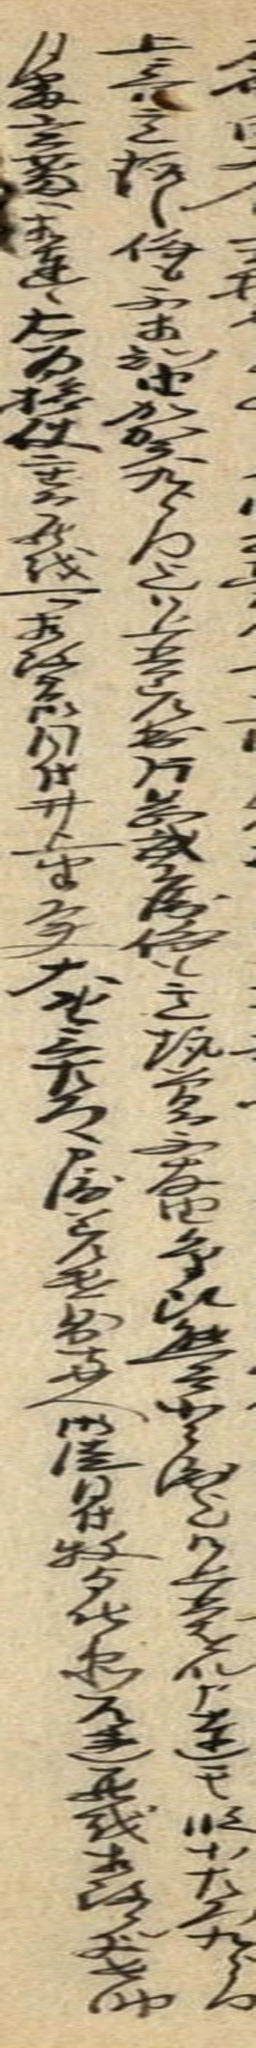月番玄蕃へ相達候右為検使重て罷越可相改旨御目付井上半大夫大野三左衛門へ申渡差遣則両人御徒目付牧与次兵衛召連罷越相改候処長助
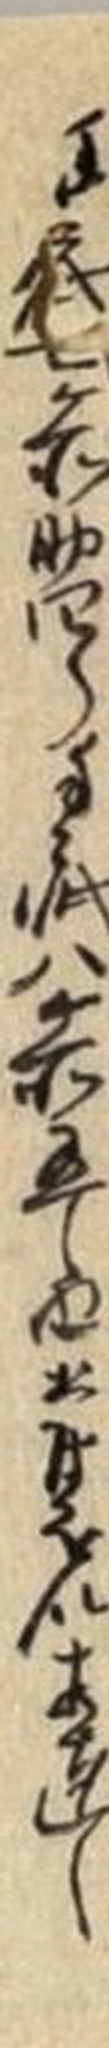手疵七ヶ所助四郎手疵八ヶ所有之由書付を以相達之

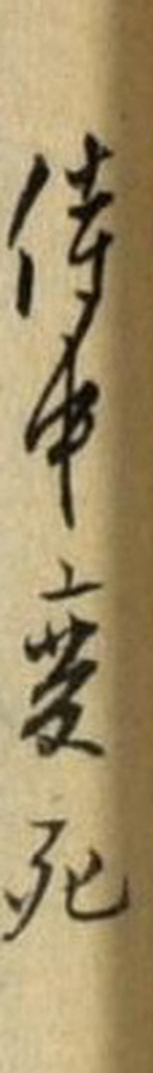侍中変死
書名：御停止異変死失
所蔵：福井県文書館 Fukui Prefectural Archives
